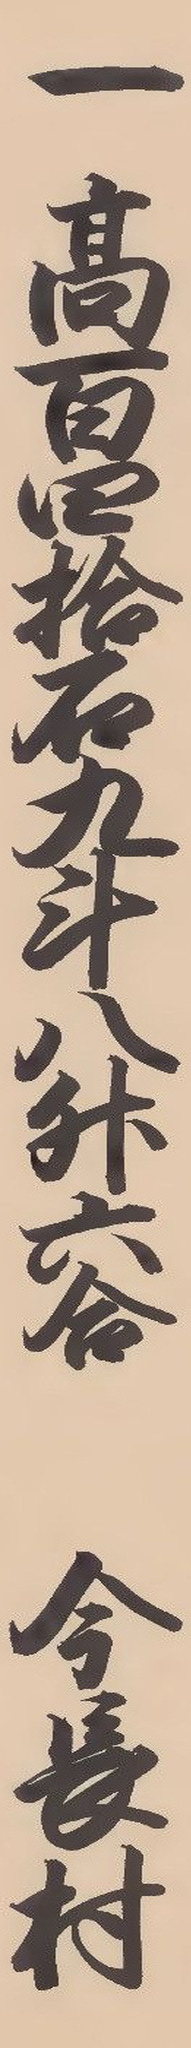一高百四拾石九斗八升六合今長村
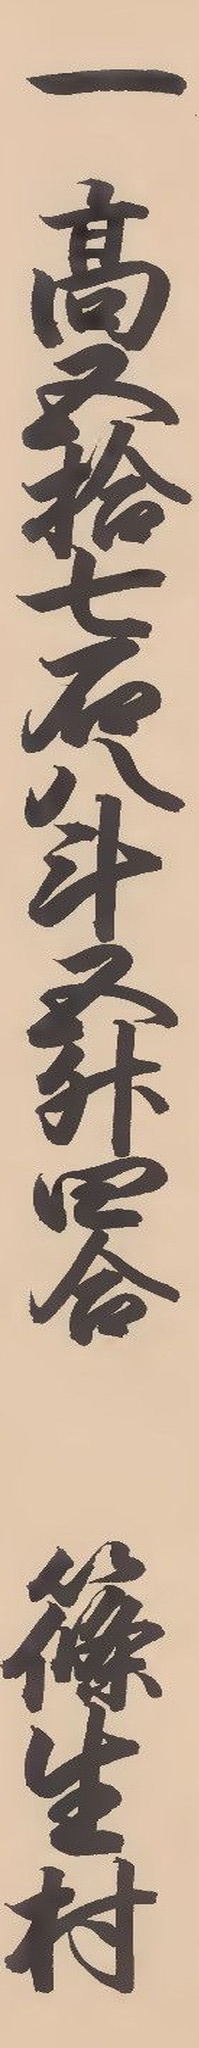一高五拾七石八斗五升四合篠生村
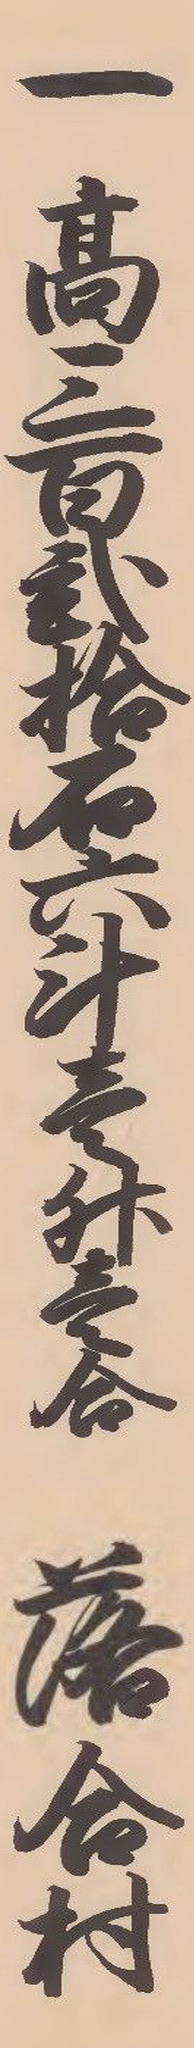一高三百弐拾石六斗壱升壱合落合村
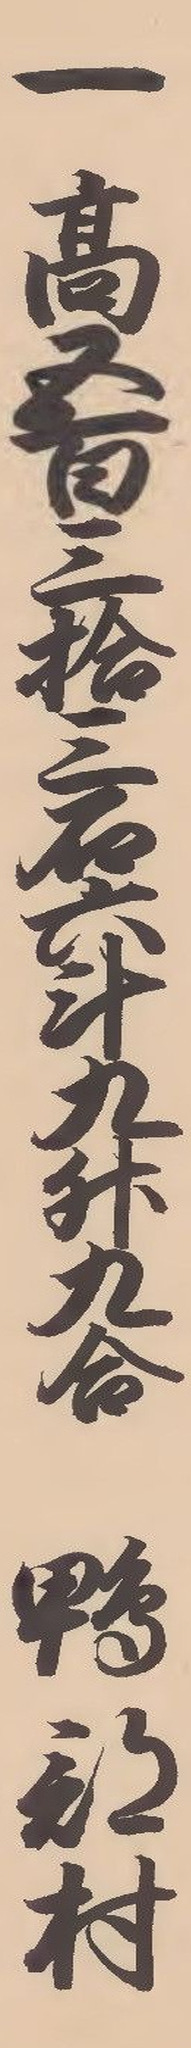一高五百三拾三石六斗九升九合鴨部村
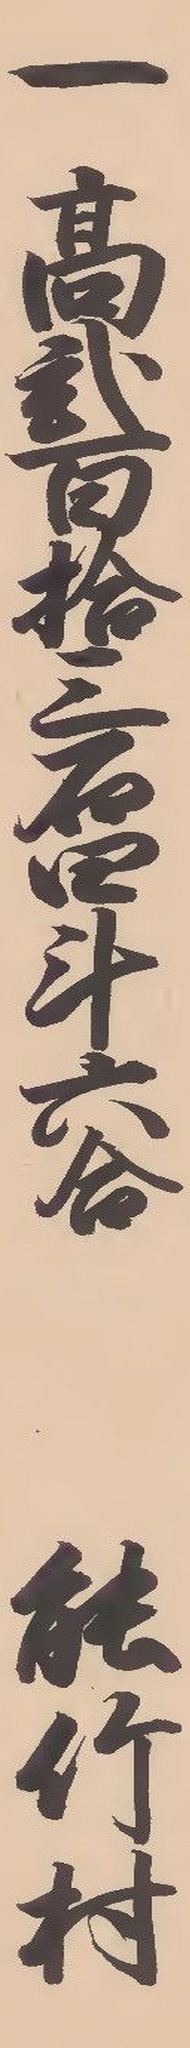一高弐百拾三石四斗六合能竹村

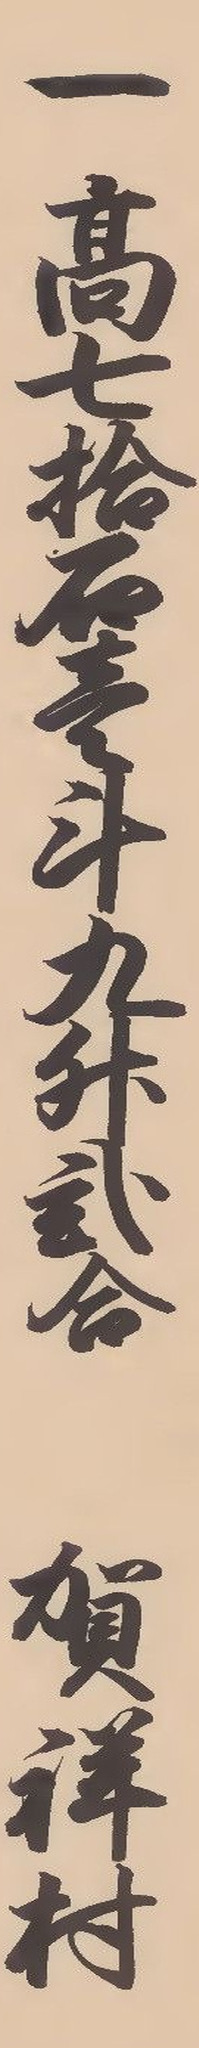一高七拾石壱斗九升弐合賀祥村
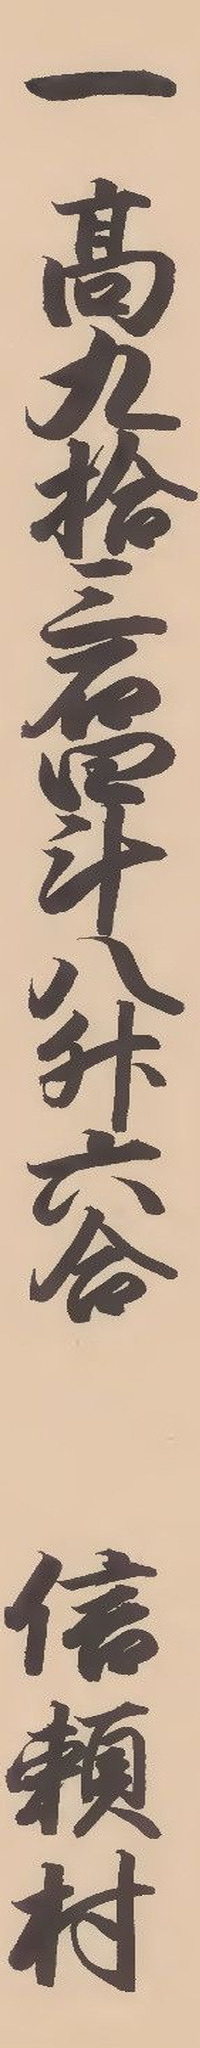一高九拾三石四斗八升六合信頼村
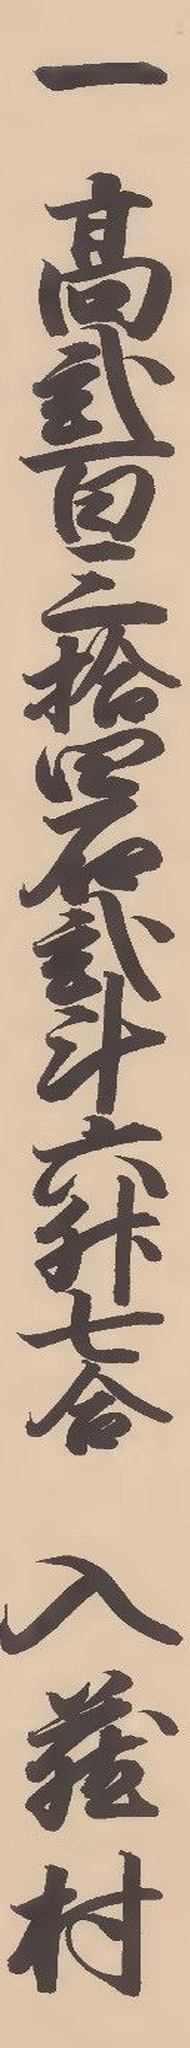一高弐百三拾四石弐斗六升七合入蔵村
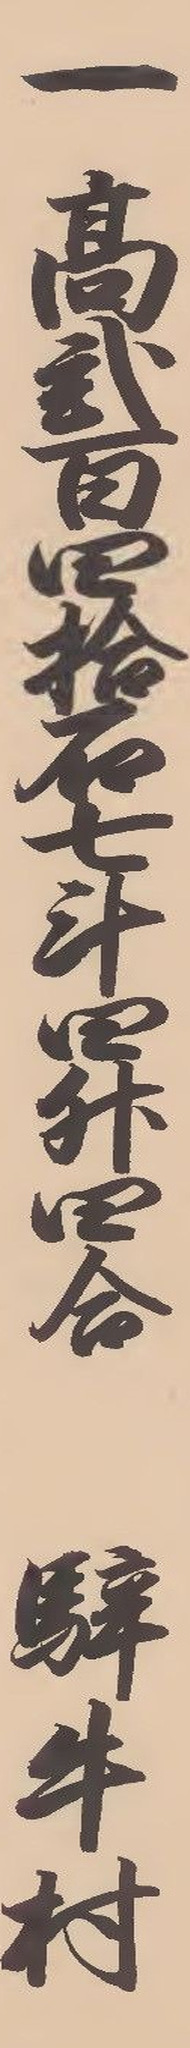一高弐百四拾石七斗四升四合騂牛村
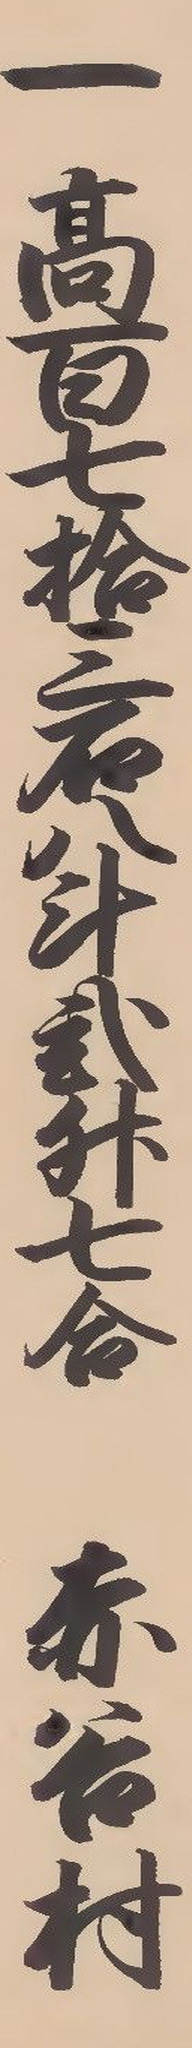一高百七拾三石八斗弐升七合赤谷村
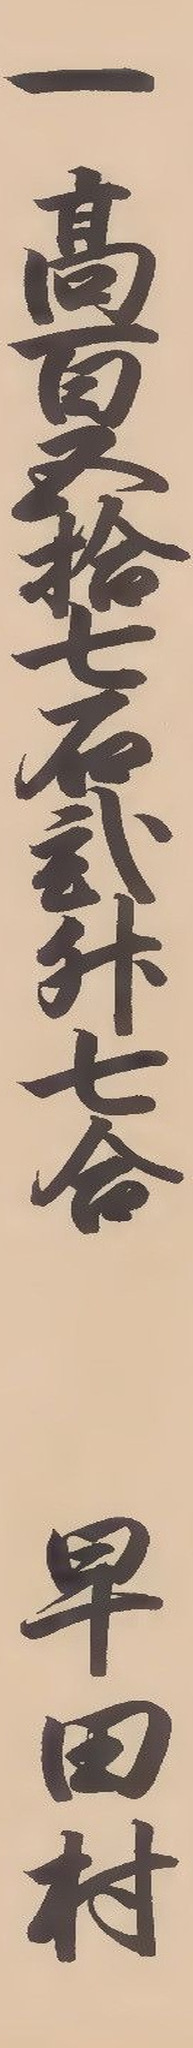一高百五拾七石弐升七合早田村
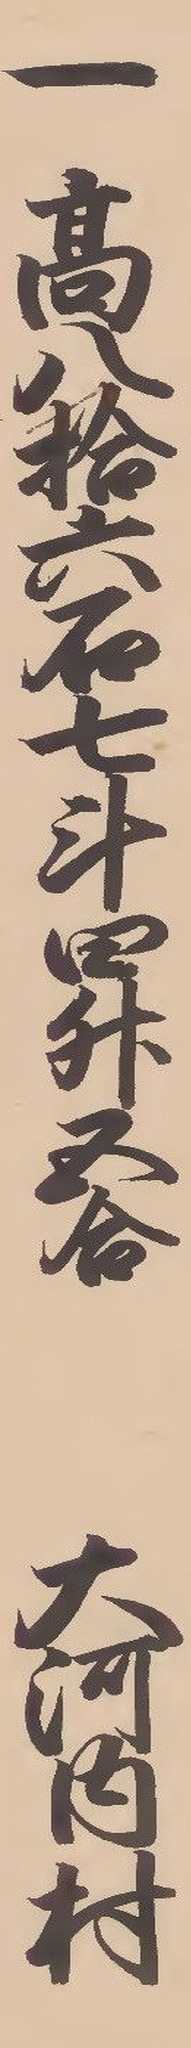一高八拾六石七斗四升五合大河内村

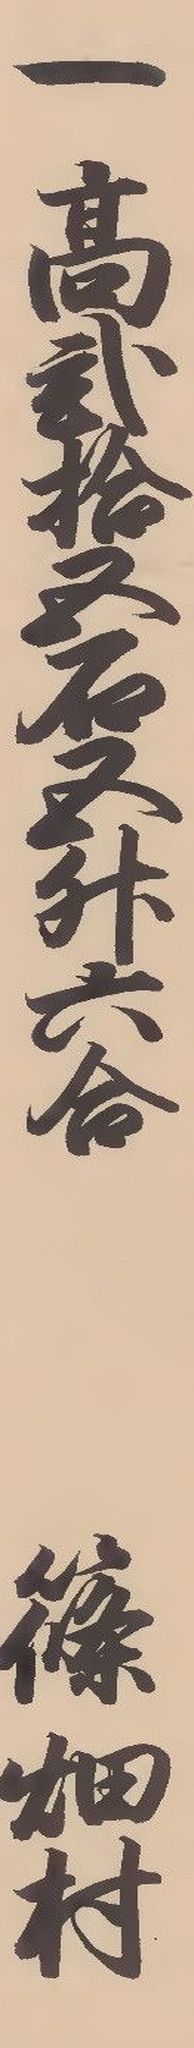一高弐拾五石五升六合篠畑村
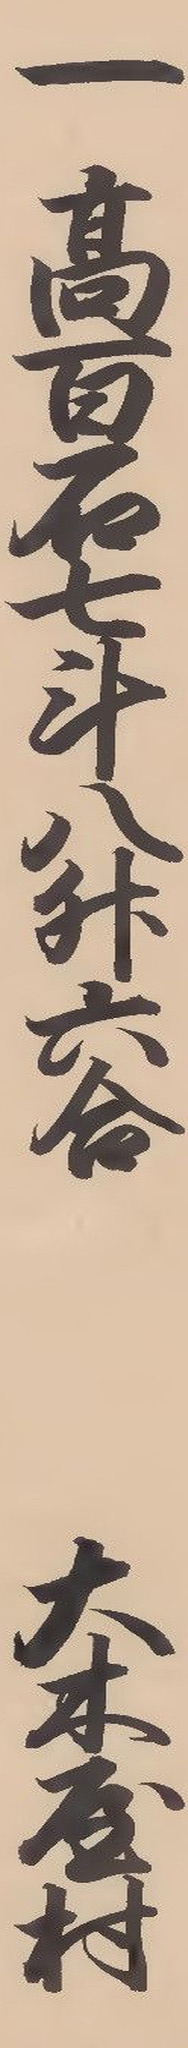一高百石七斗八升六合大木屋村
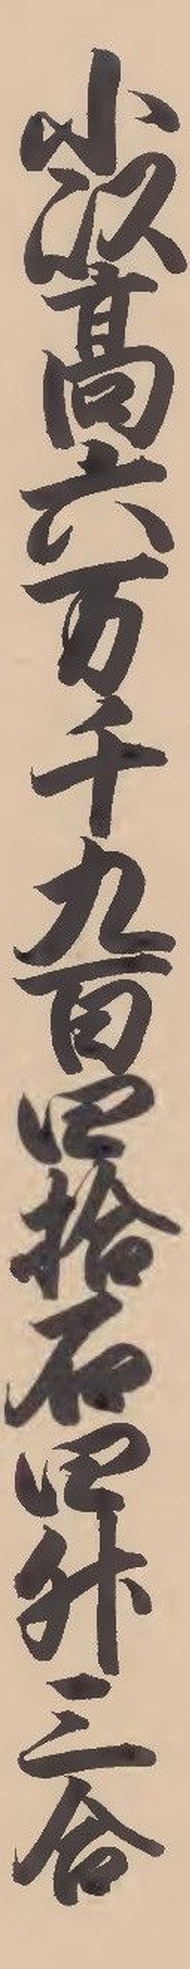小以高六万千九百四拾石四升三合
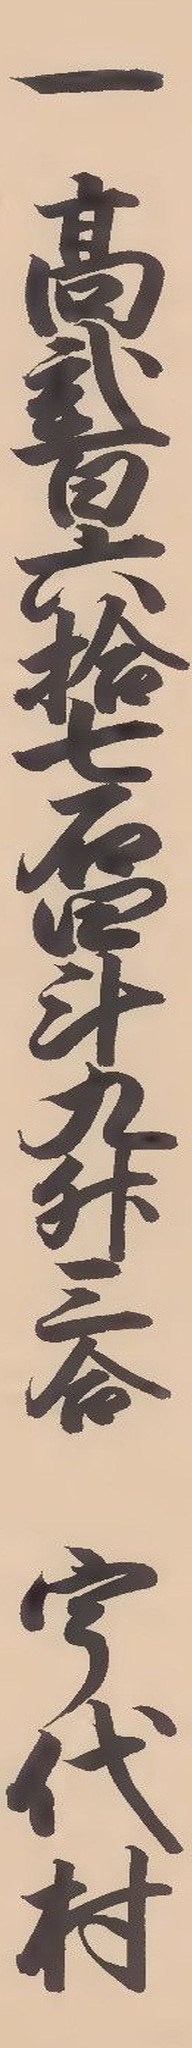一高弐百六拾七石四斗九升三合宇代村
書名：伯耆国郷帳
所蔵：国立公文書館 National Archives of Japan
